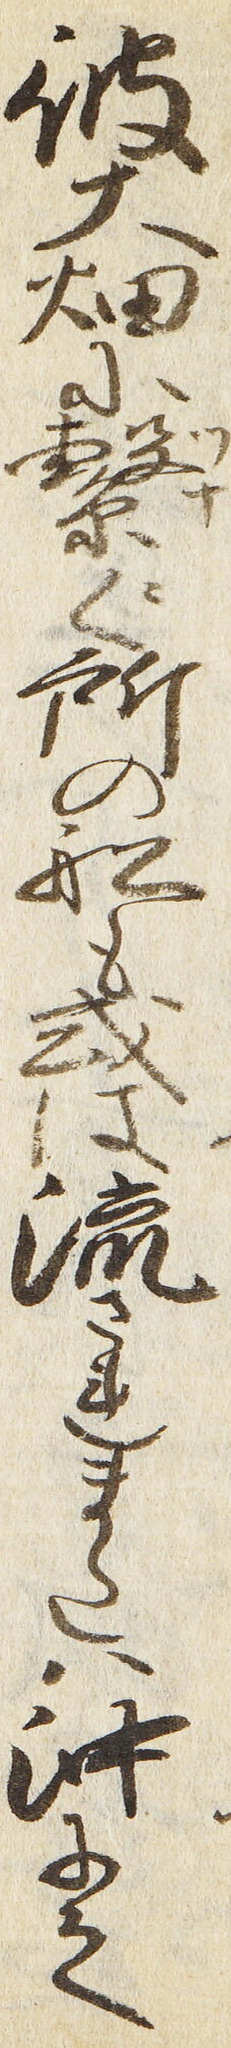彼大畑に繋ぐ所の船も或は流されまたは沖にて
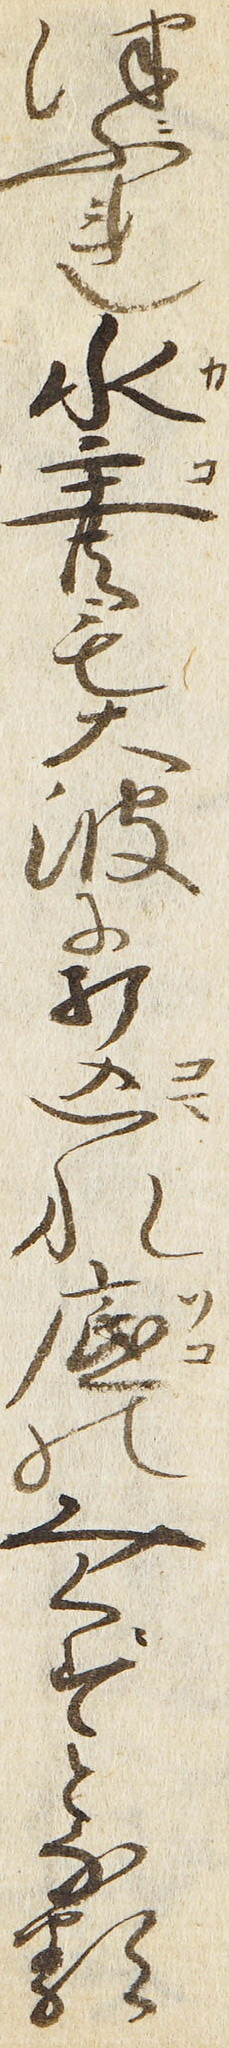つぶれ水主共も大波に打込れ底のみくずとなる
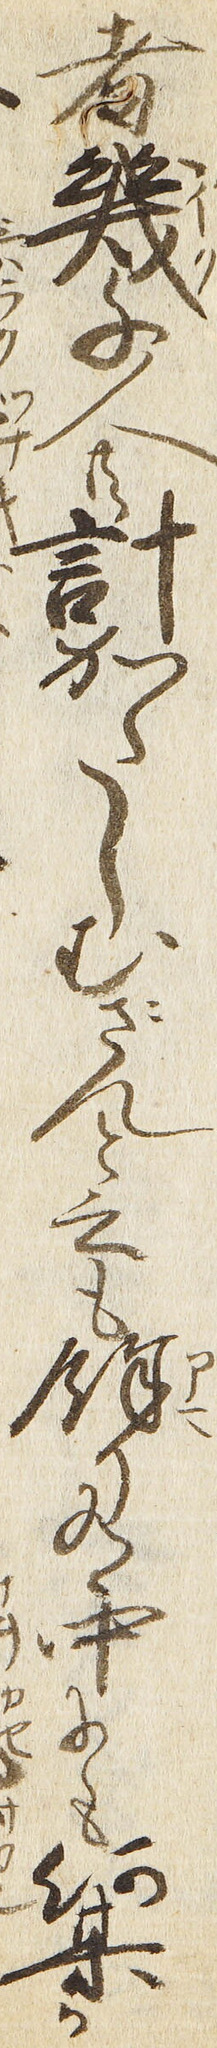者幾千人共計かたしむざんと云も余り有中にも何某か
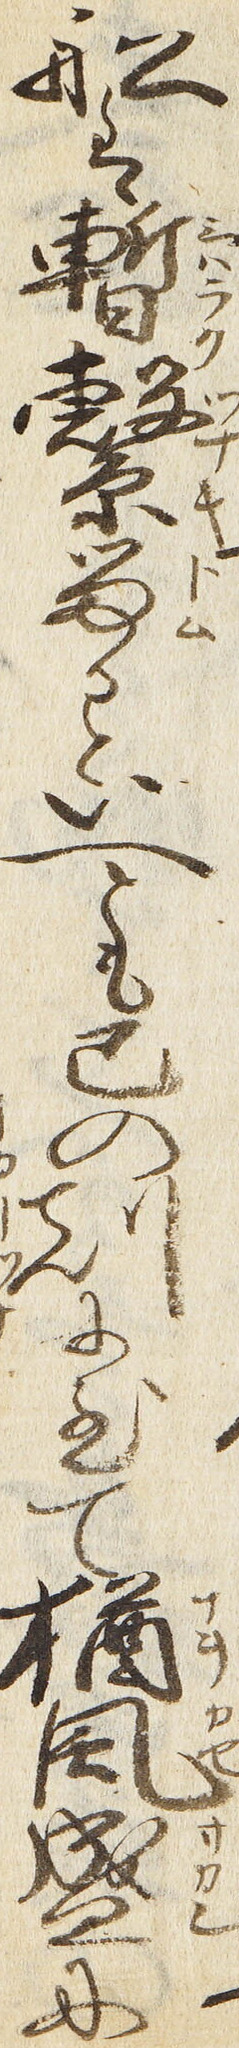船は暫繋留るといへとも巳の刻に至て猶風盛に
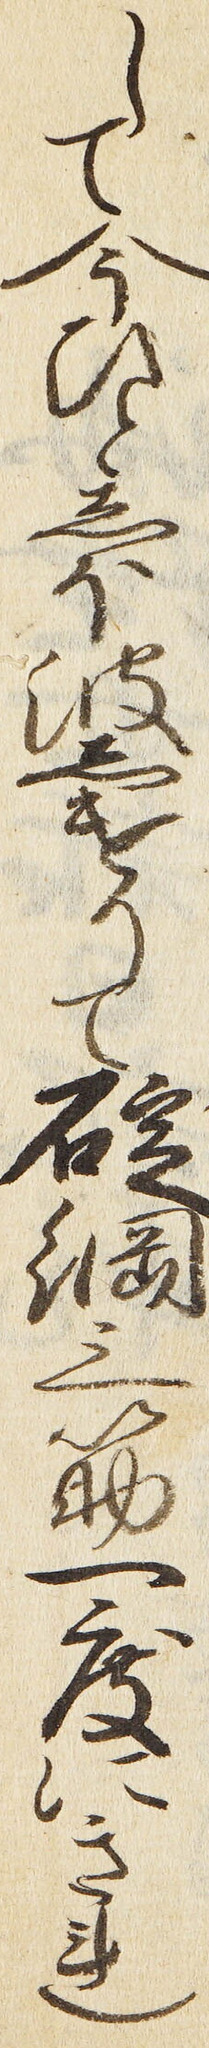して今ひとしほ波しけりて碇綱三筋一度にきれ
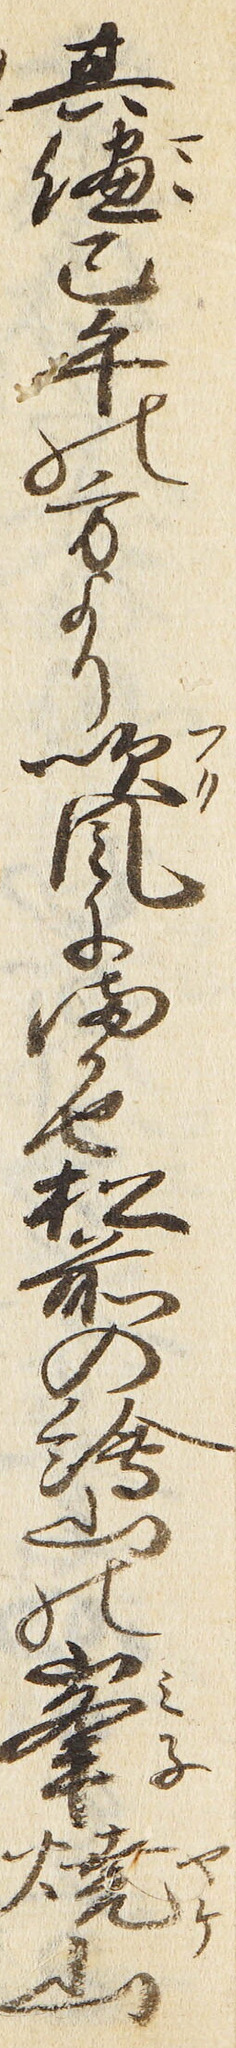其儘巳午の方より吹風にまかせ松前の絵山の峯焼山
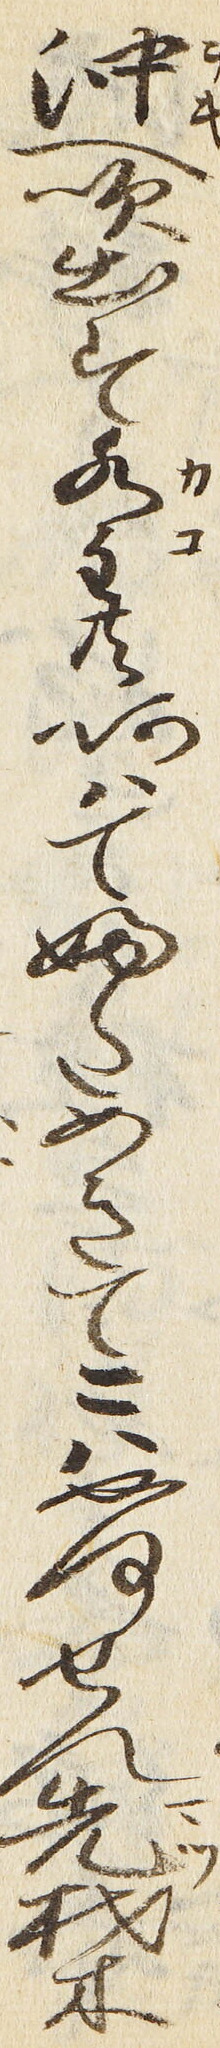沖へ吹出す水主共あはてふためきてこは如何せん先材木
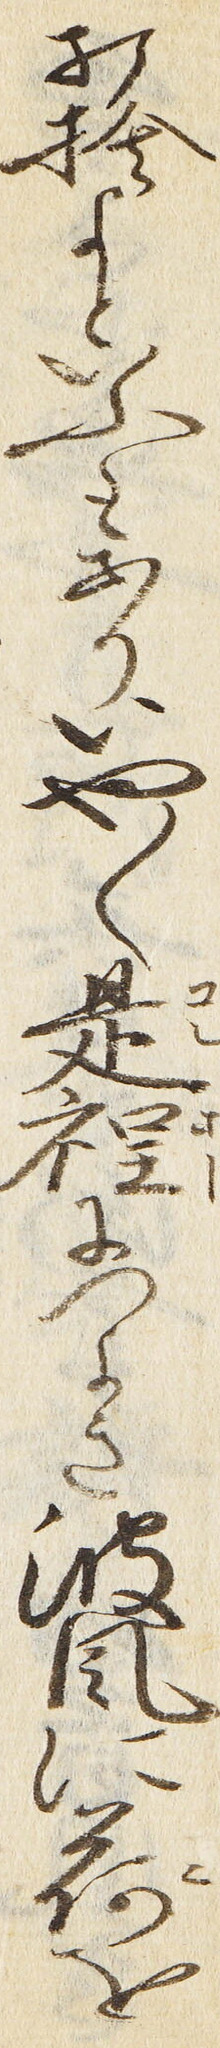打捨よといふもありいや〳〵是程につよき波風に荷を
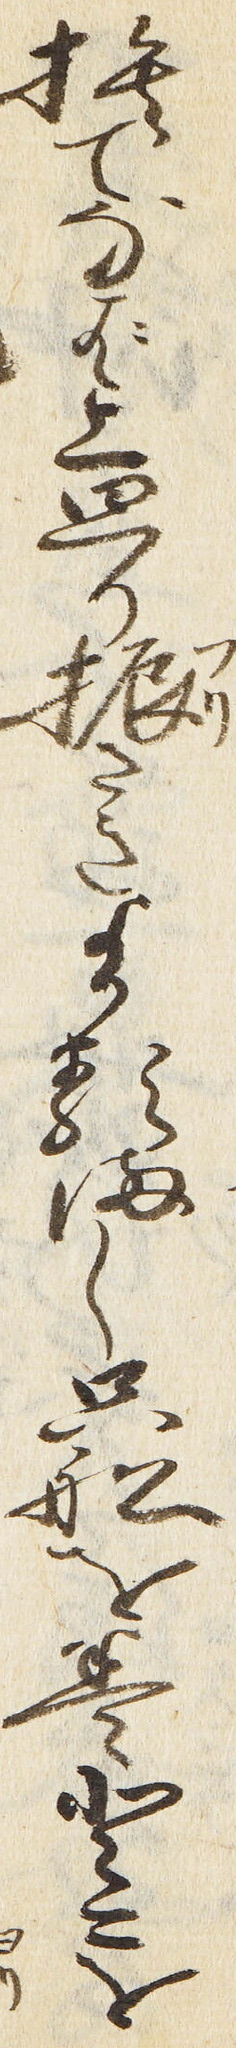捨てなば上廻り振さきよかるまし只船を巻とこを
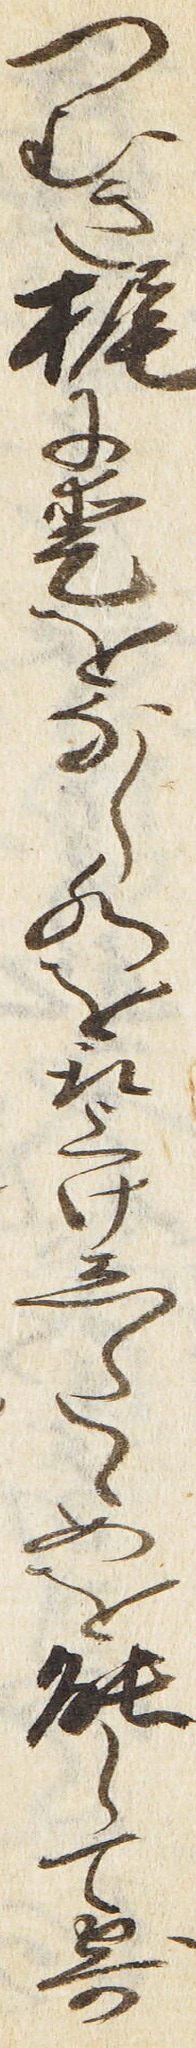つむき梶にをなし水を取上けしたくめを能して寄
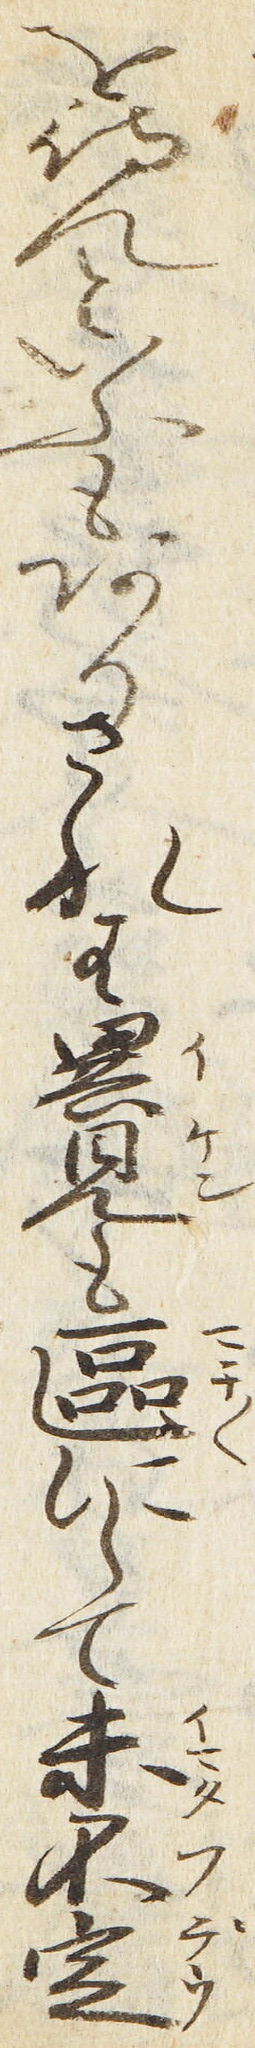を待んといふもありされは異見も区にして未不定
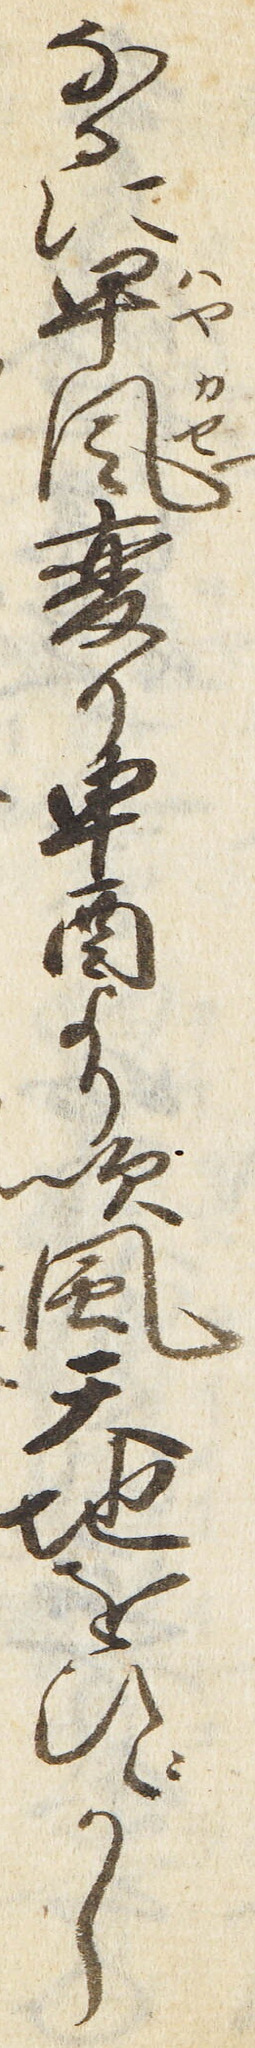なるに早風変り申酉より吹風天地をひゞかし
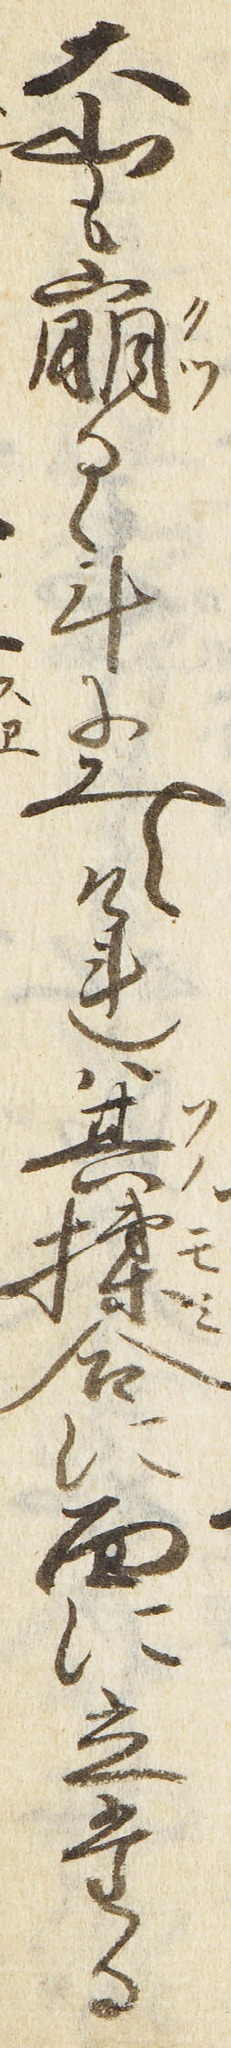大山も崩るゝ計にみえけれは其揉合に面に立たる
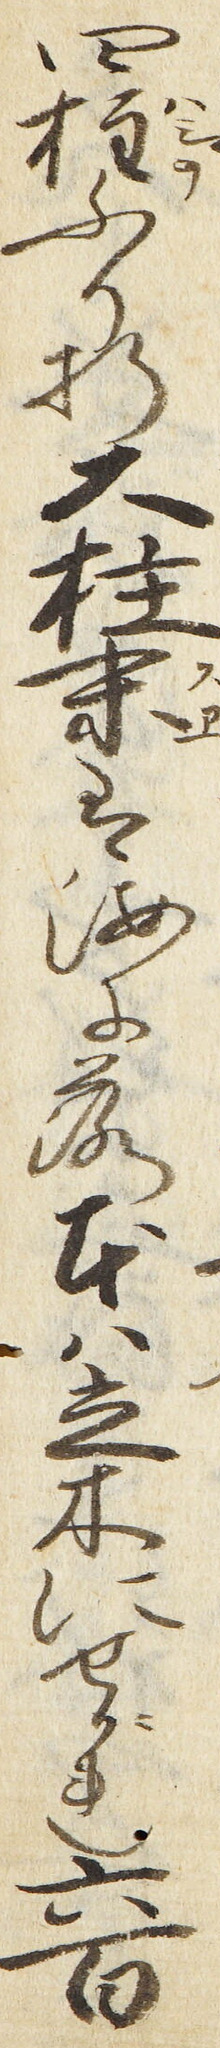四柱ふり折大柱末は海に落本は立木にせがれ六百

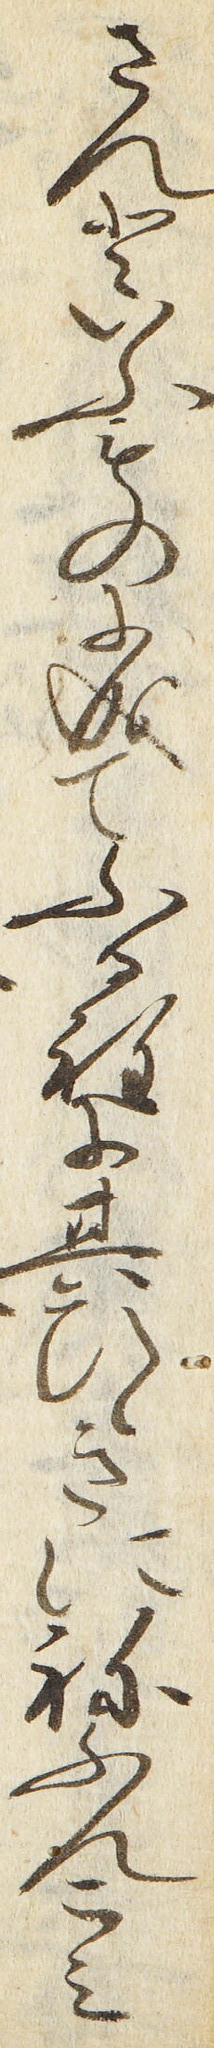さんといふものに成てふる程に其ひゞきにねふんこみ
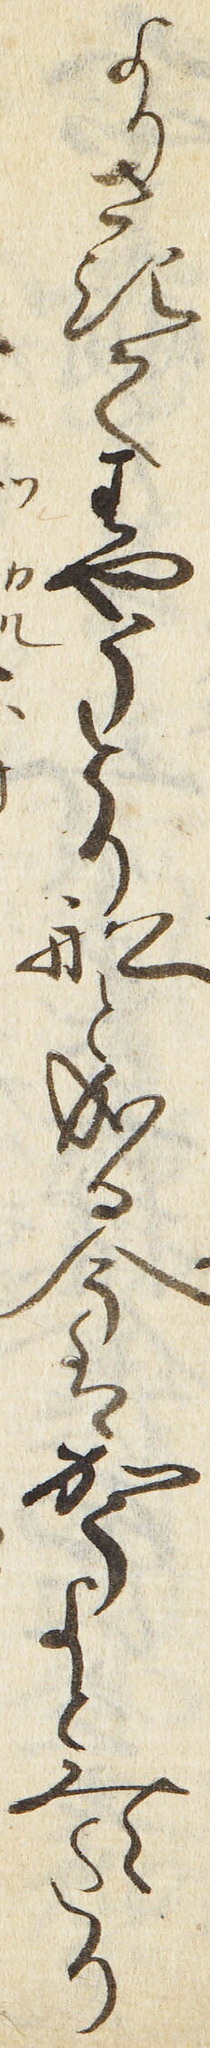よりさきてわやうとり船と成る今はかうよとみえたり
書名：海陸世話日記
